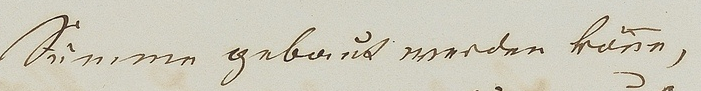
Summe gebaut werden könne,
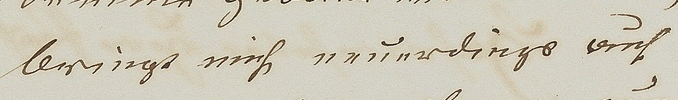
bringt mich neuerdings auf
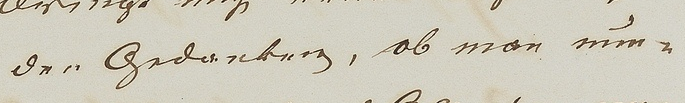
den Gedanken, ob man nun-
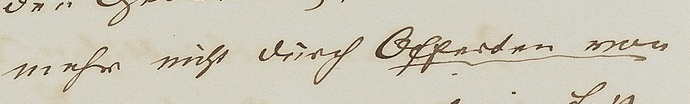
mehr nicht durch Offerten von
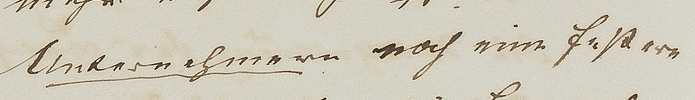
Unternehmen noch eine festere
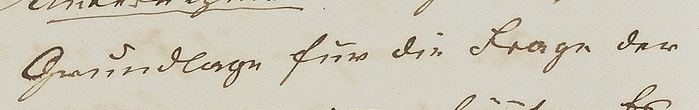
Grundlage für die Frage der
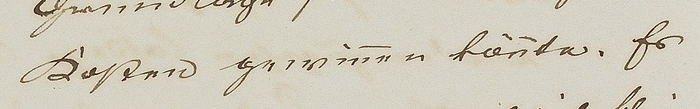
Kosten gewinnen könnte. Es
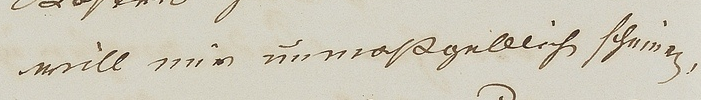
will mir unmaßgeblich scheinen,
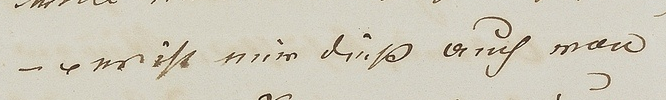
– & es ist mir dieß auch von
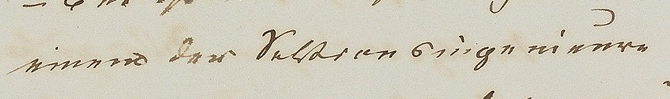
einem der Sektionsingenieure
